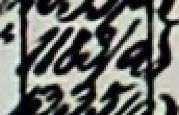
1183/a
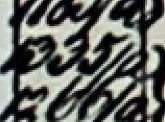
1335/a
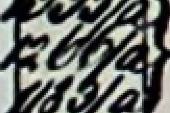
1266/a
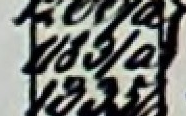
1183/a
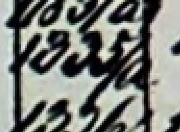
1835/a
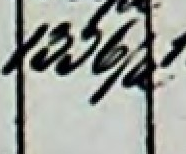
1336/a
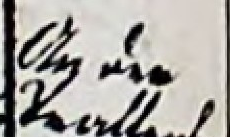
An der
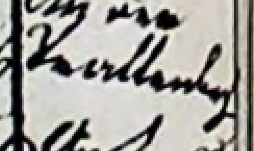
Trattenbach
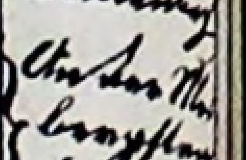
An der Mos„
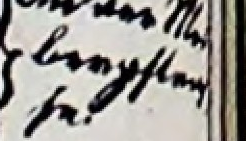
bergstras„
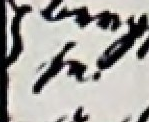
se.
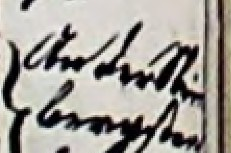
An der Stein
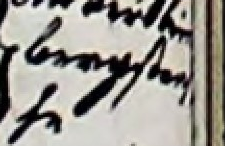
bergstras
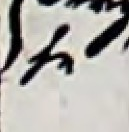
se
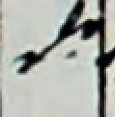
Do
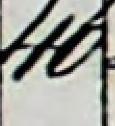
46
